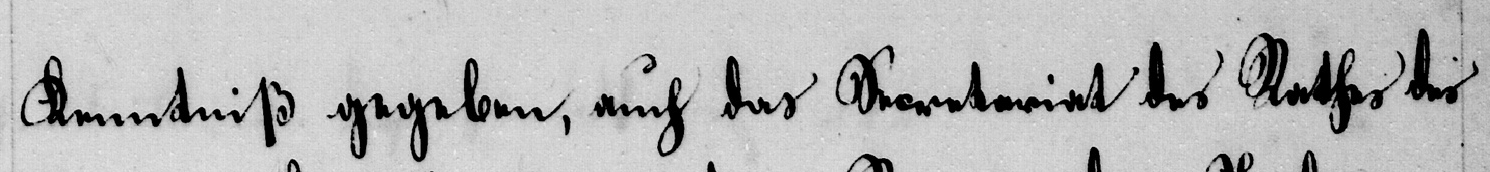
Kenntniß gegeben, auch das Secretariat des Rathes des
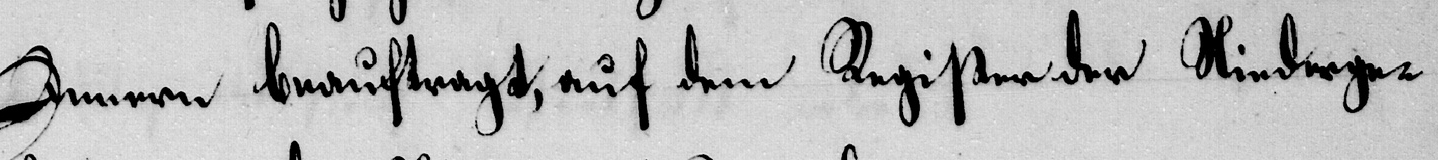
Innern beauftragt, auf dem Register der Niederge¬
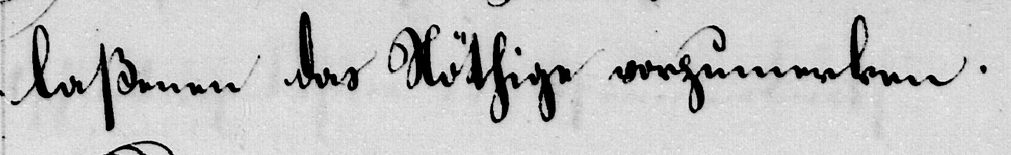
laßenen das Nöthige vorzumerken.
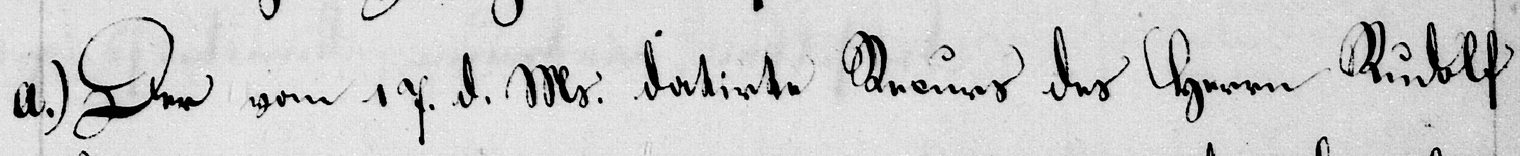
a.) Der vom 17. d. Ms. datirte Recurs des Herrn Rudolf
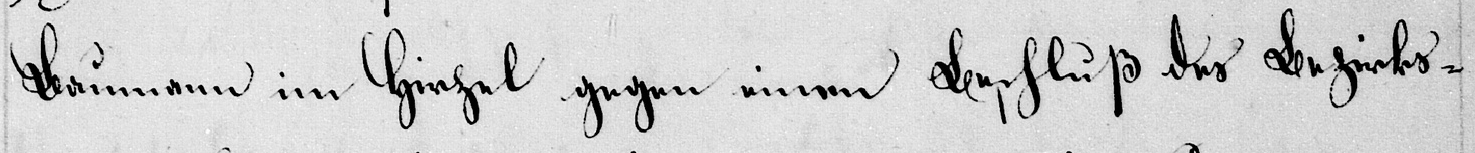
Baumann im Hirzel gegen einen Beschluß des Bezirks¬
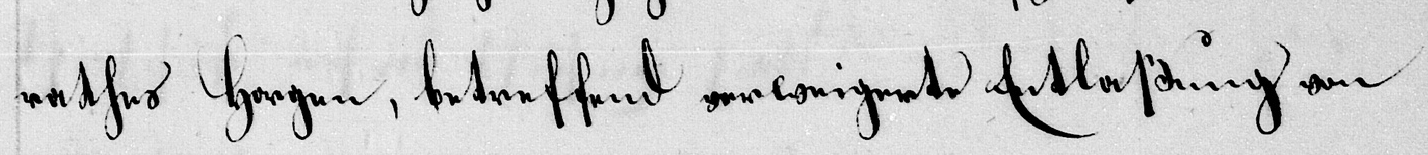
rathes Horgen, betreffend verweigerte Entlaßung von
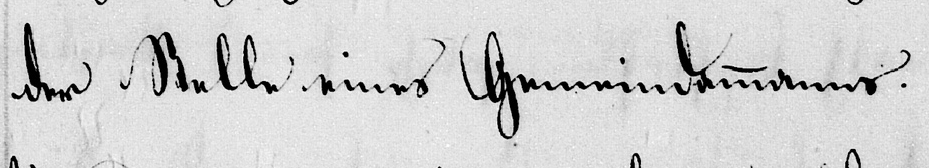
der Stelle eines Gemeindammanns.
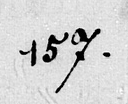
17.
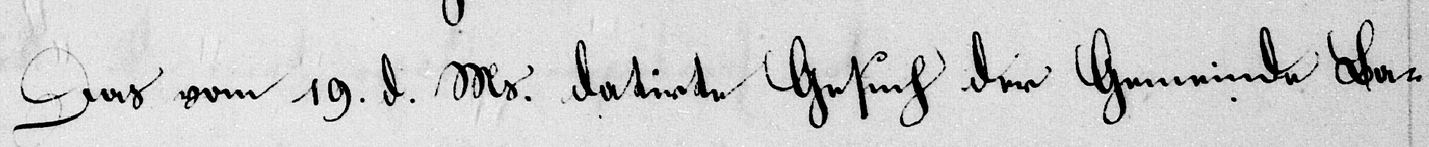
Das vom 19. d. Ms. datirte Gesuch der Gemeinde Ba¬
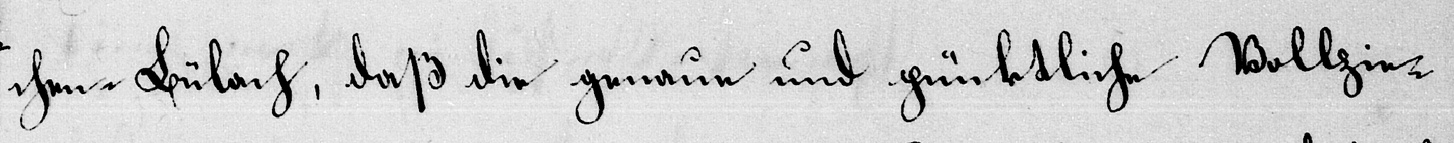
chen-Bülach, daß die genaue und pünktliche Vollzie¬
